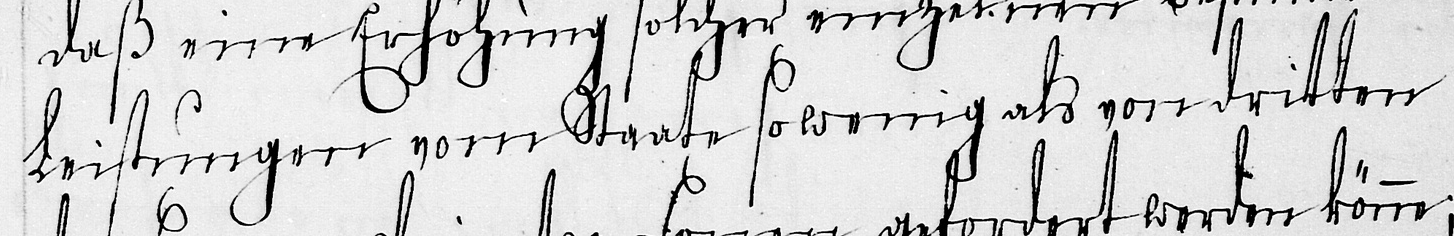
Leistungen vom Staate sowenig als von dritten
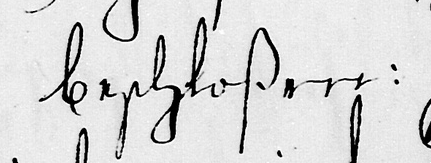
beschloßen:
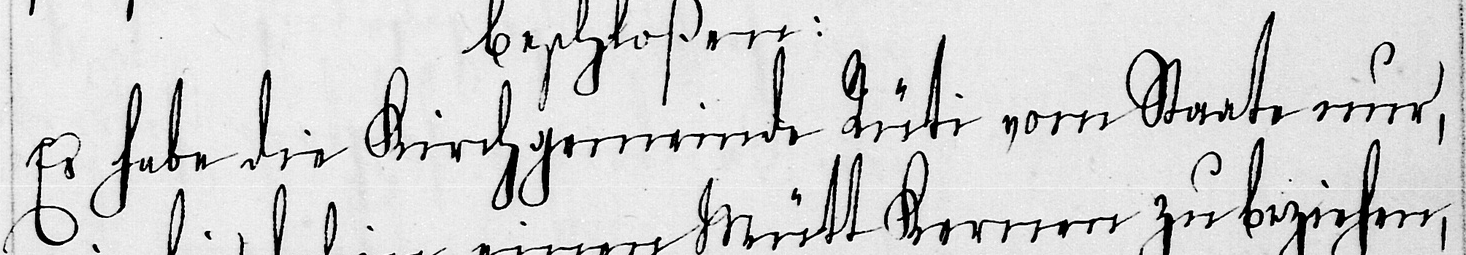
Es habe die Kirchgemeinde Rüti vom Staate nur,
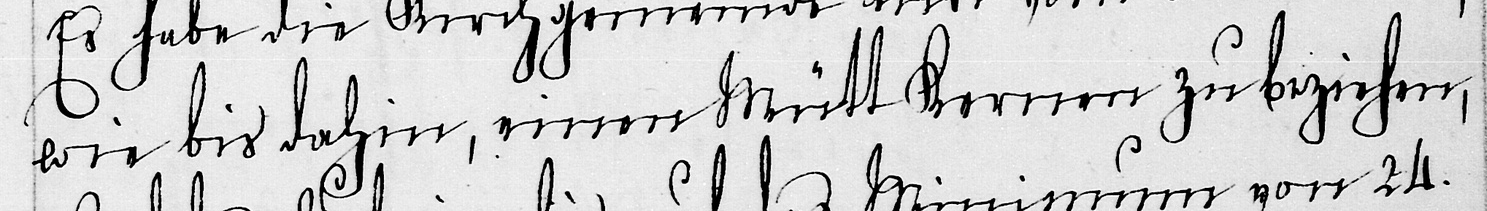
wie bis dahin, einen Mütt Kernen zu beziehen,
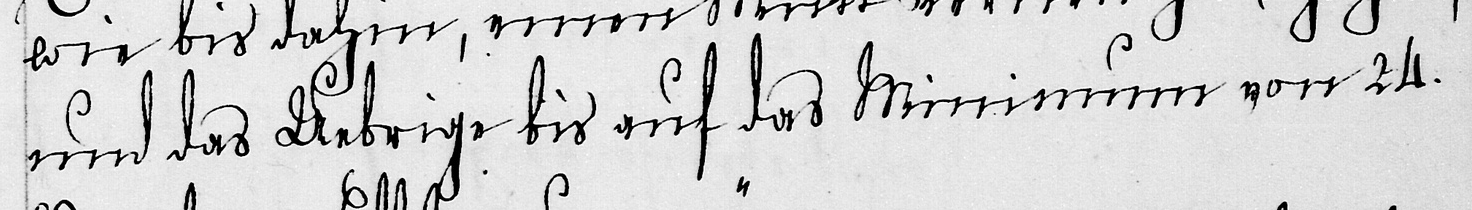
und das Uebrige bis auf das Minimum von 24.
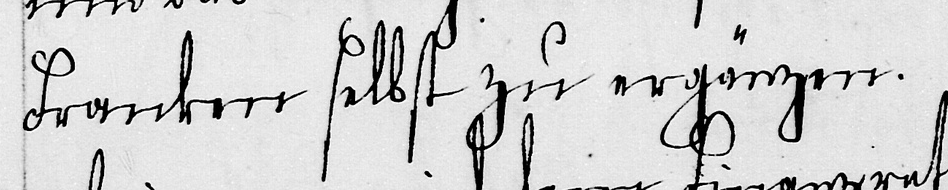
Franken selbst zu ergänzen.
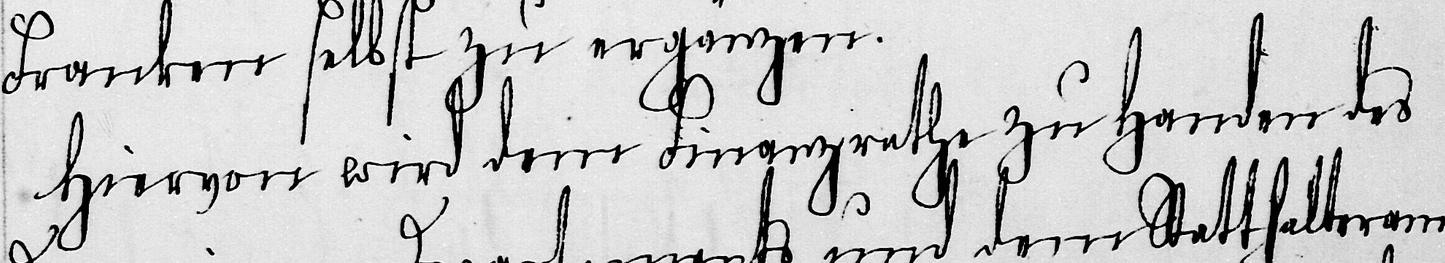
Hiervon wird dem Finanzrathe zu Handen des
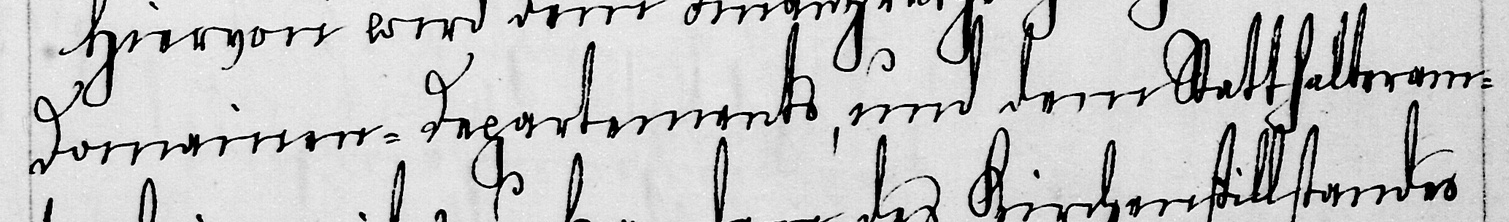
Domainen-Departements, und dem Statthalteram¬
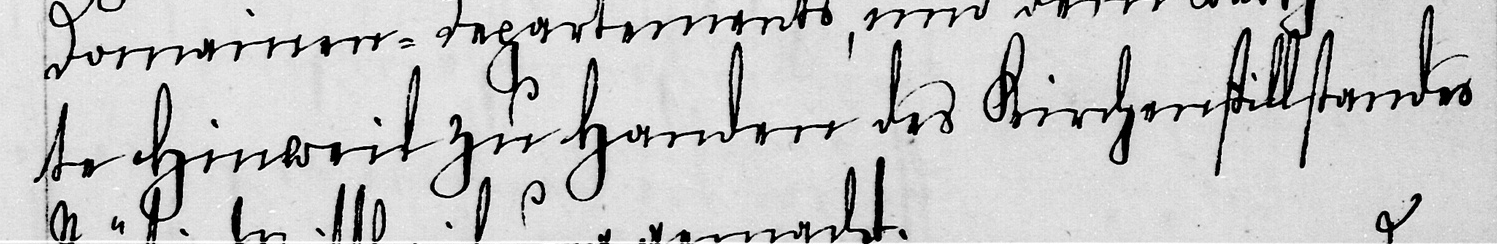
te Hinweil zu Handen des Kirchenstillstandes
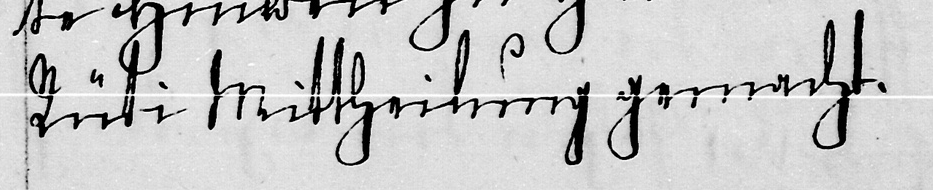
Rüti Mittheilung gemacht.
